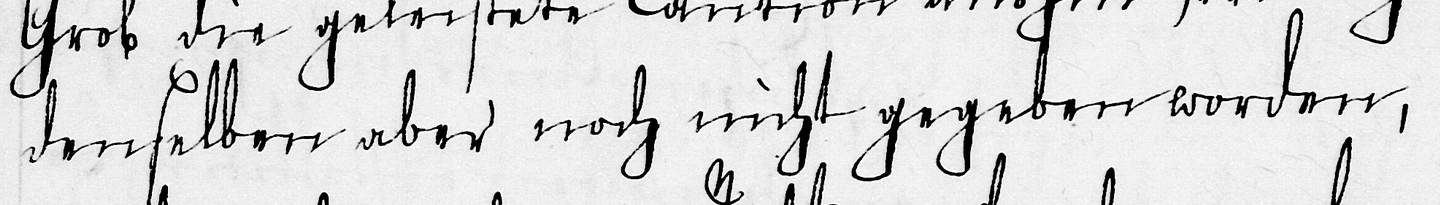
denselben aber noch nicht gegeben worden,
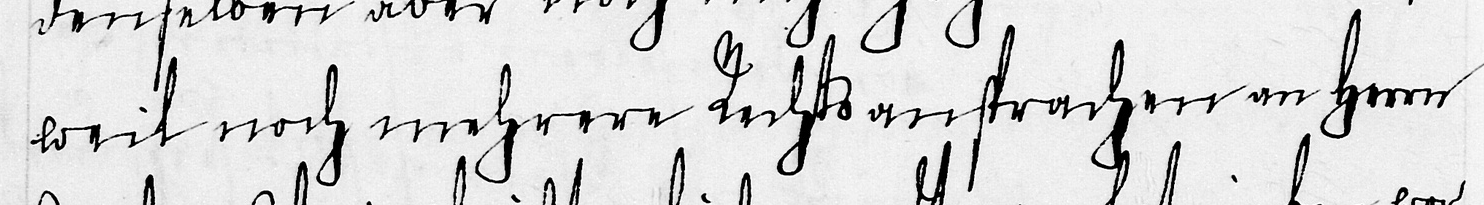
weil noch mehrere Rechtsansprachen an Herrn
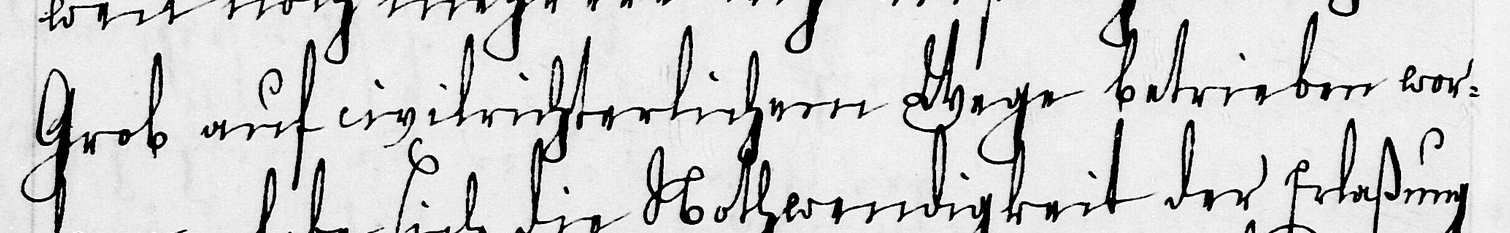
Grob auf civilrichterlichem Wege betrieben wor¬
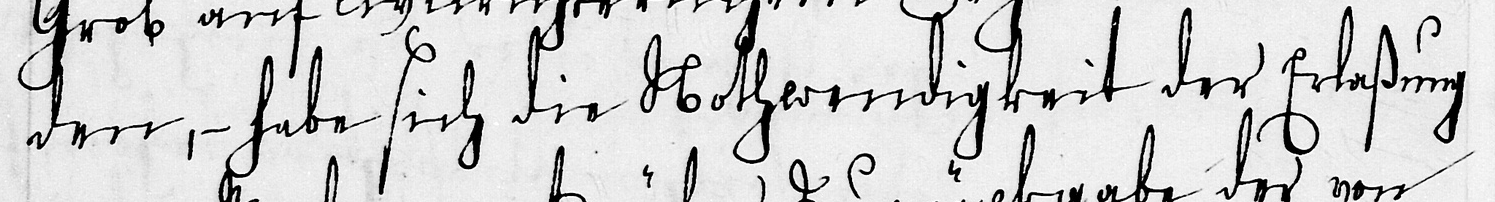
den, – habe sich die Nothwendigkeit der Erlaßung
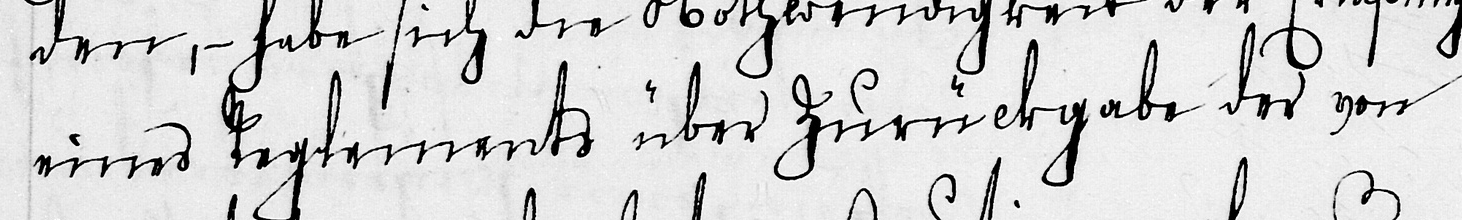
eines Reglements über Zurückgabe der von
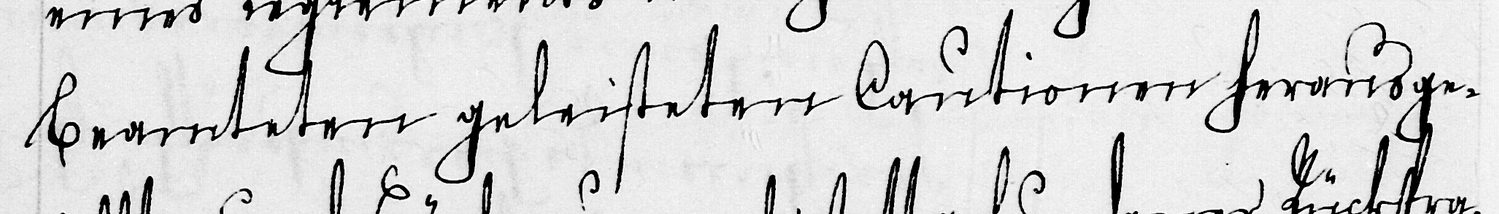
Beamteten geleisteten Cautionen herausges¬
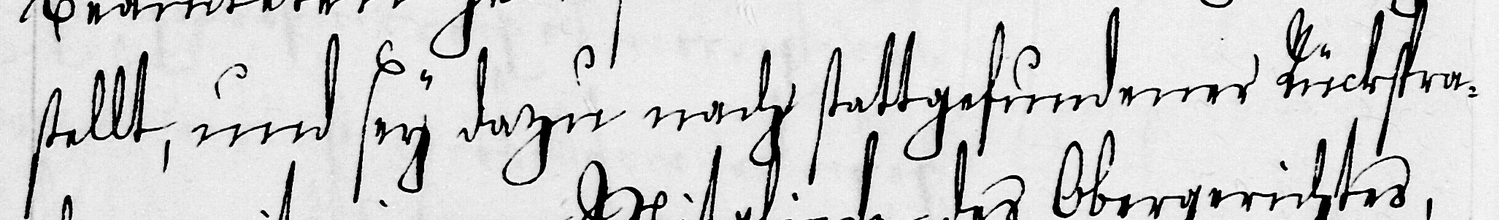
tellt, und sey dazu nach stattgefundener Rückspra¬
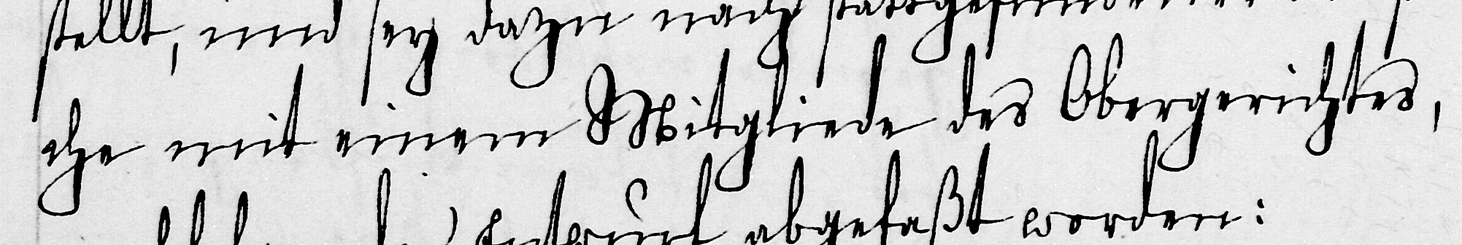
che mit einem Mitgliede des Obergerichtes,
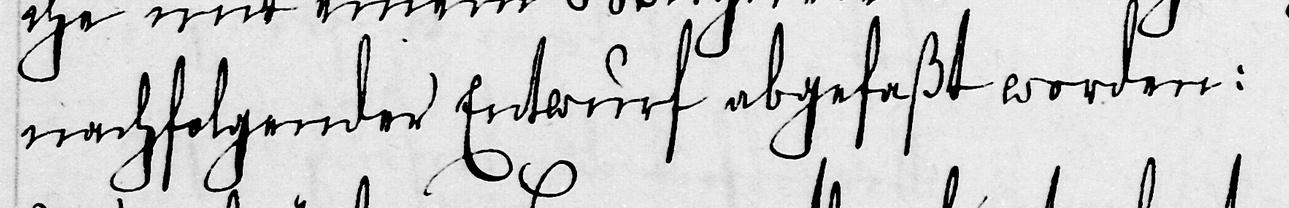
nachfolgender Entwurf abgefaßt worden:
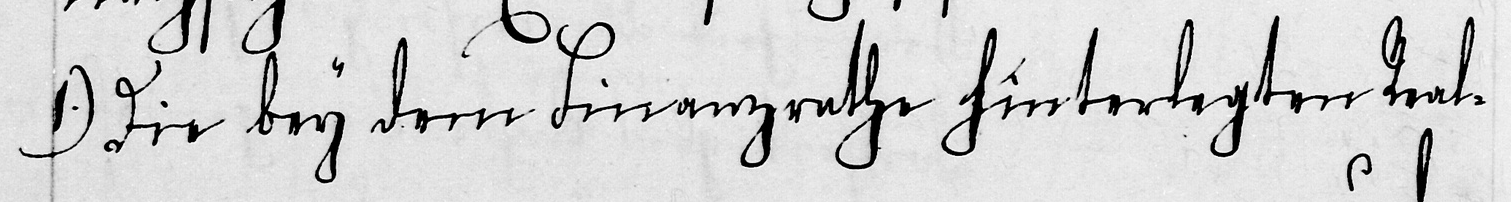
1.) Die bey dem Finanzrathe hinterlegten Real-
